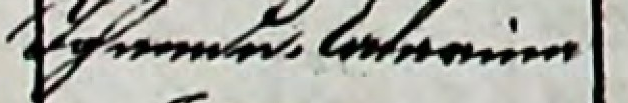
Johann u. Calarina
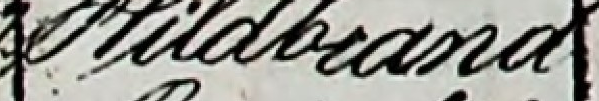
Hildbrand
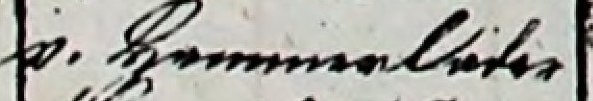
v. Herrnhaus
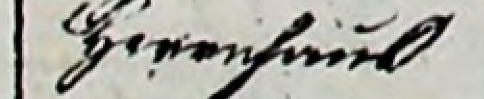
Herenhau?
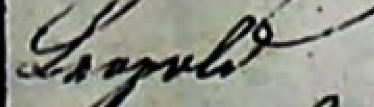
Leopold
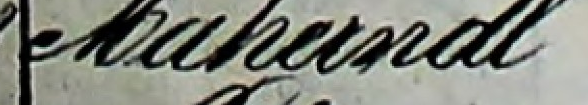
Maherndl
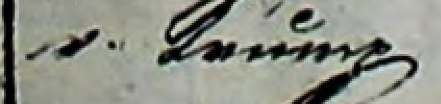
v. Krump
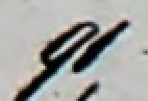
91
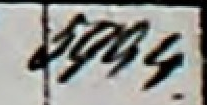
590,4
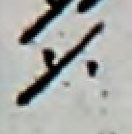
./.
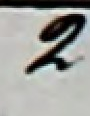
2
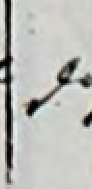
do
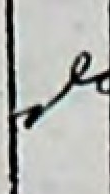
do
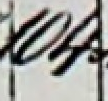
104
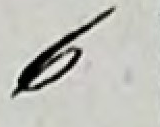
6
